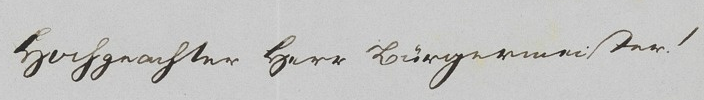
Hochgeachter Herr Bürgermeister!
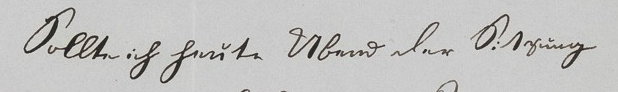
Sollte ich heute Abend der Sitzung
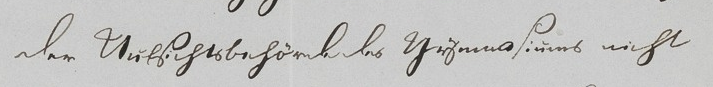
der Aufsichtsbehörde des Gymnasiums nicht
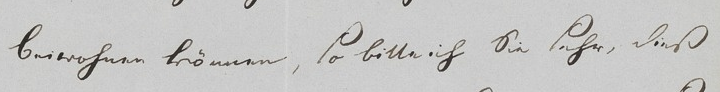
beiwohnen können, so bitte ich Sie sehr, dieß
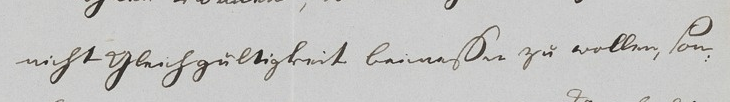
nicht Gleichgültigkeit beimessen zu wollen, son-
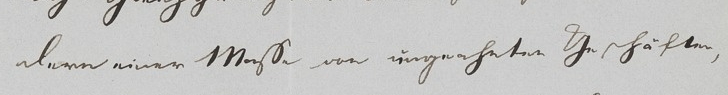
dern einer Masse von ungeahnte Geschäften,
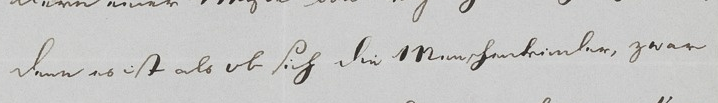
denn es ist als ob sich die Menschenkinder, zwar
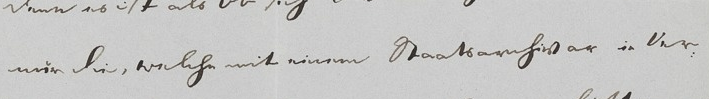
nur die, welche mit einem Staatsarchivar in Ver-
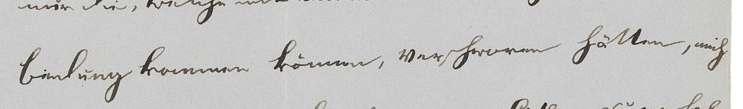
bindung kommen können, verschworen hätten, mich
